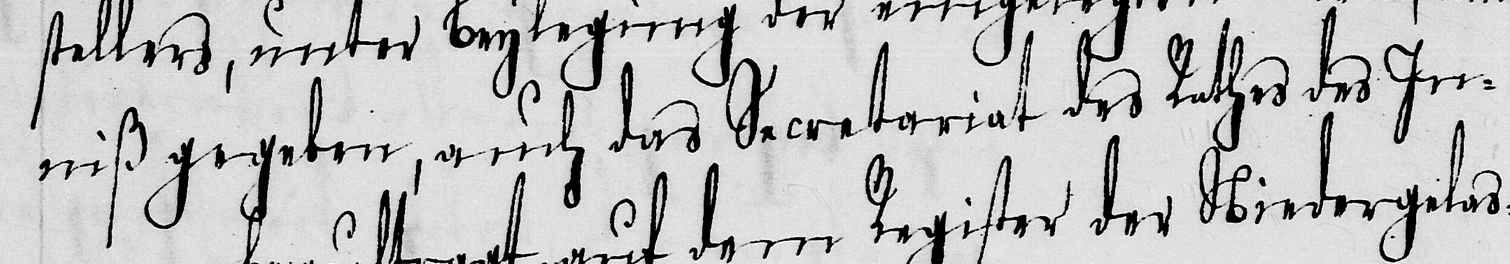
tniß gegeben, auch das Secretariat des Rathes des In¬
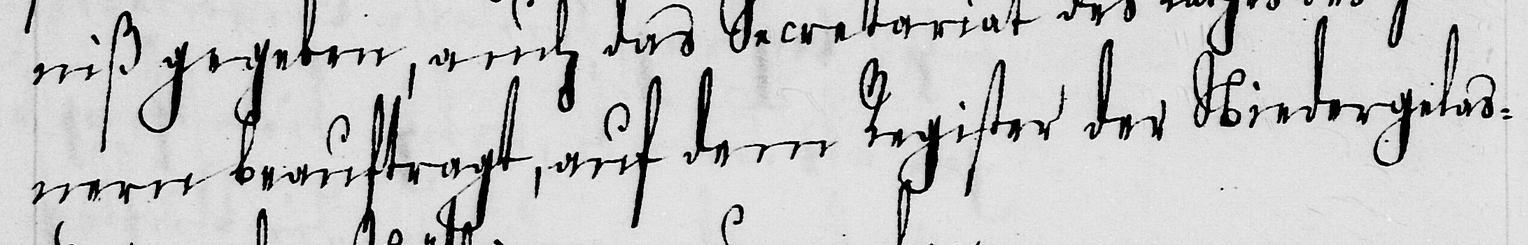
nern beauftragt, auf dem Register der Niedergelaß¬
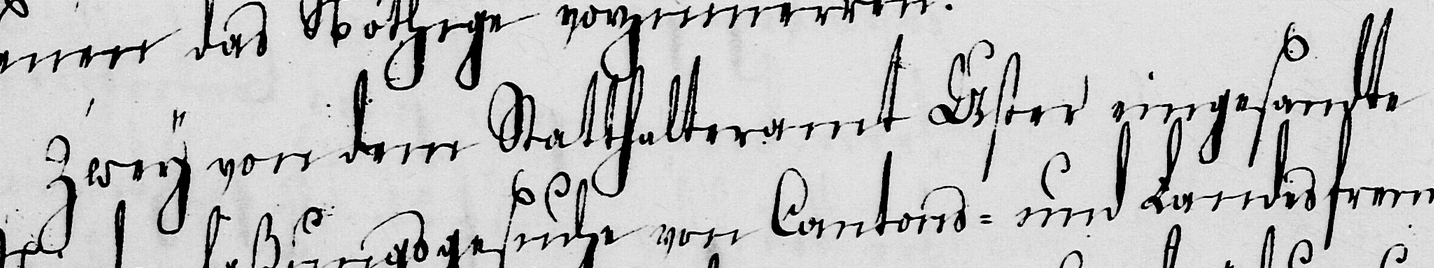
Zwey von dem Statthalteramt Uster eingesandte
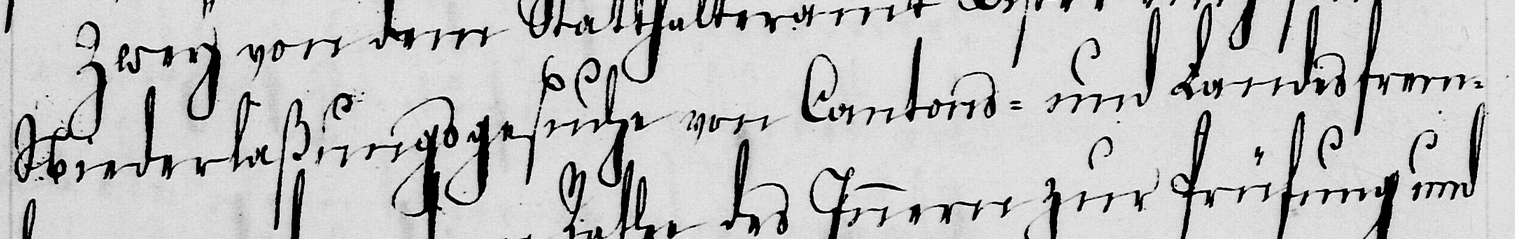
Niederlaßungsgesuche von Cantons- und Landesfrem¬
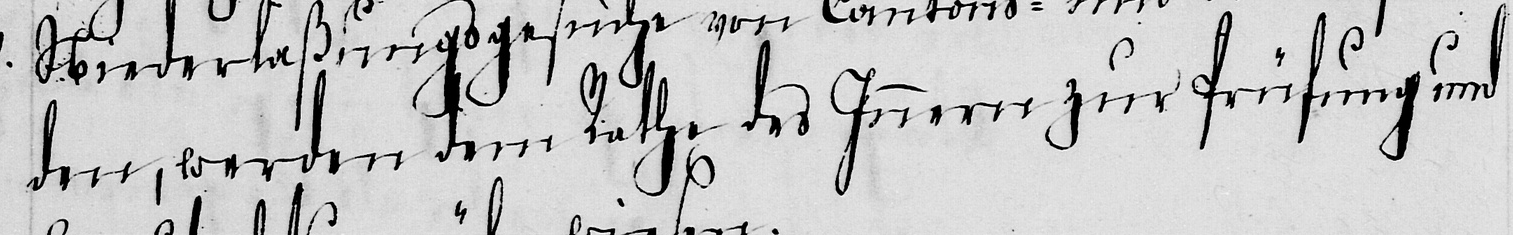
den, werden dem Rathe des Innern zur Prüfung und
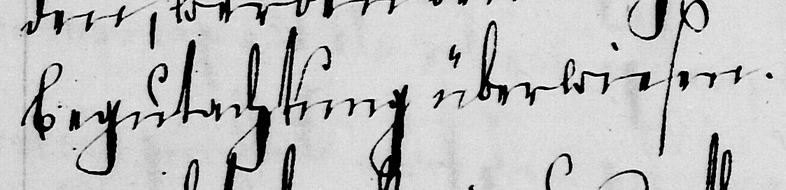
Begutachtung überwiesen.
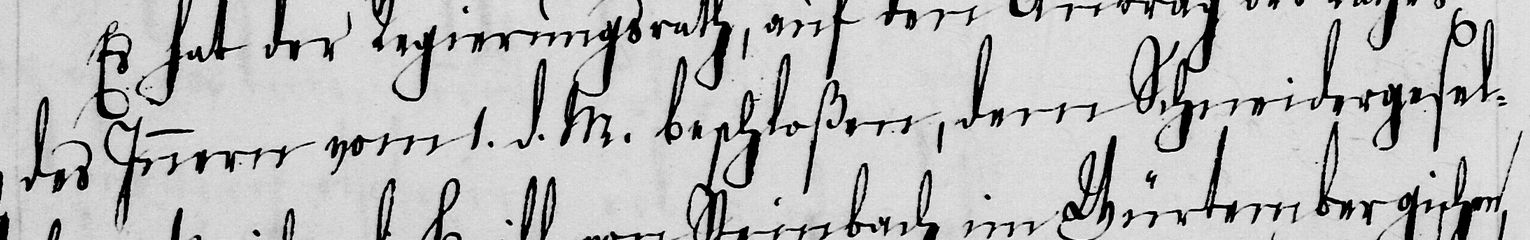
des Innern vom 1. d. M. beschloßen, dem Schneidergesel¬
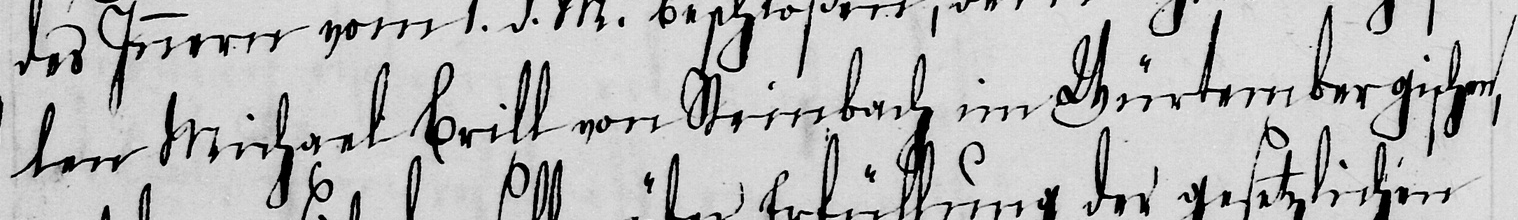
len Michael Brill von Steinbach im Würtembergische¬
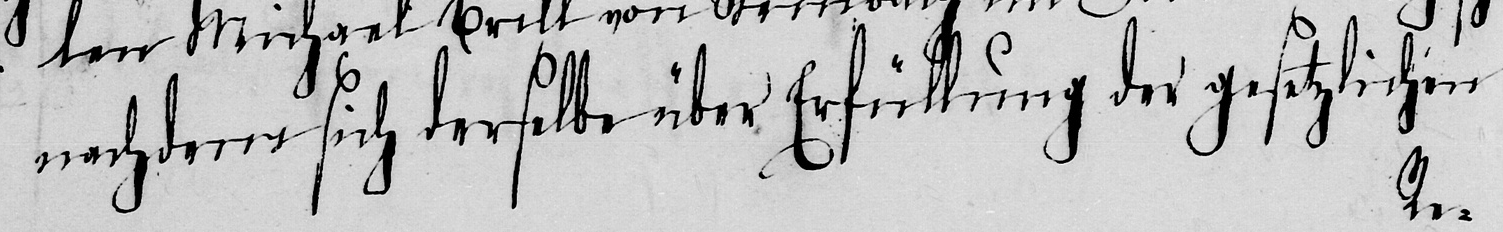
nach dem sich derselbe über Erfüllung der gesetzlichen
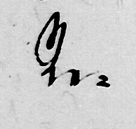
der
